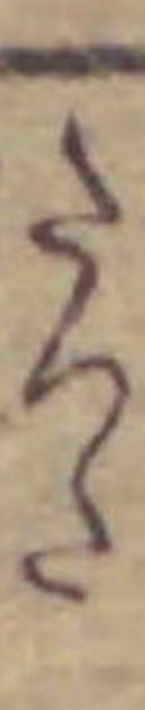たつた
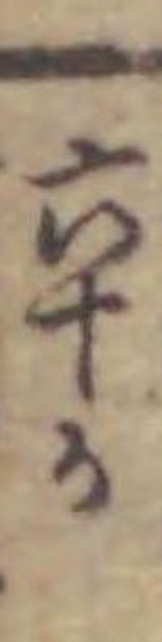六十か
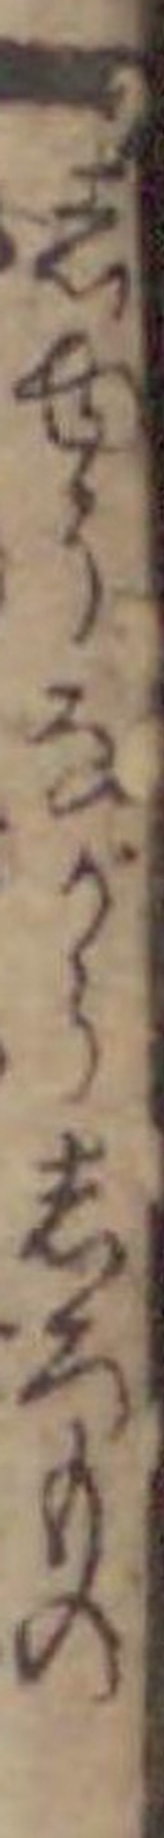しゆうながらしろもの
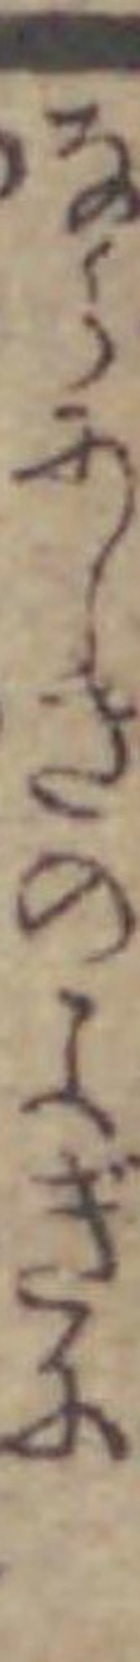ならふしきのよぎに
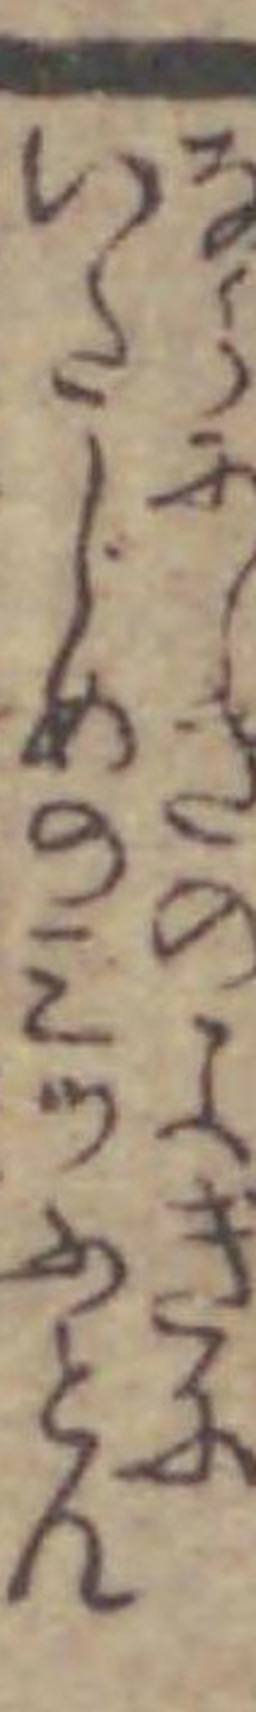いたじめの三ふとん
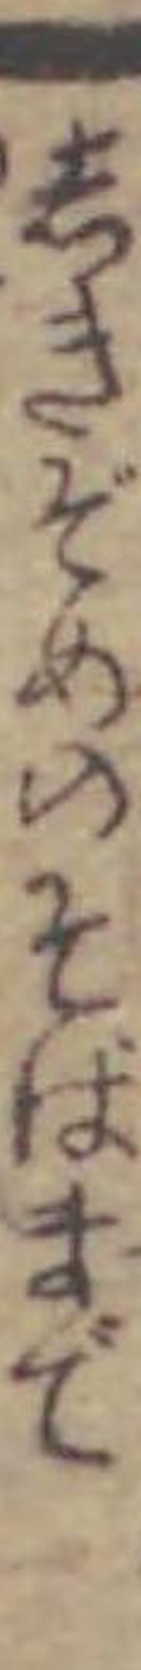しきぞめのそばまで
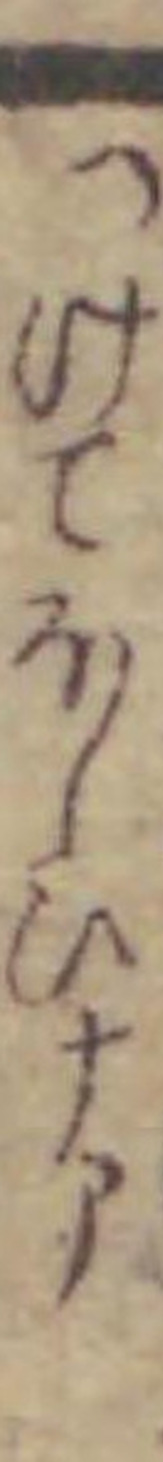つけてほしひナア
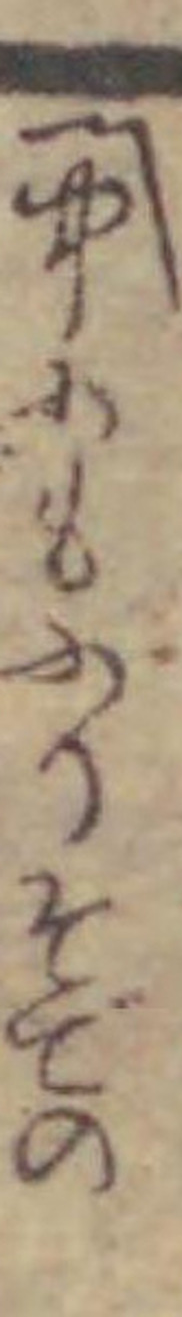「中にもふりそでの
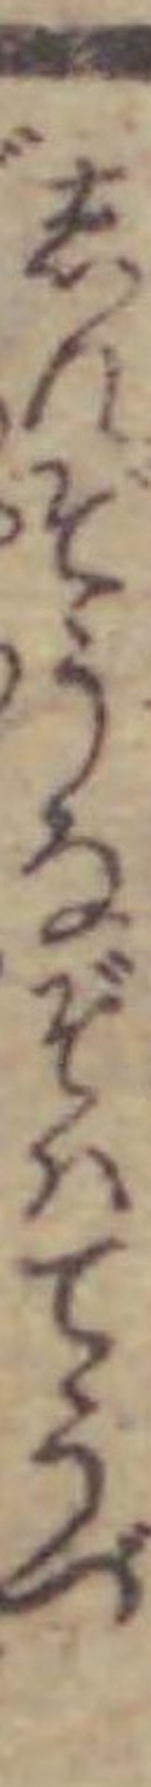しんぞうなぞはてうづ
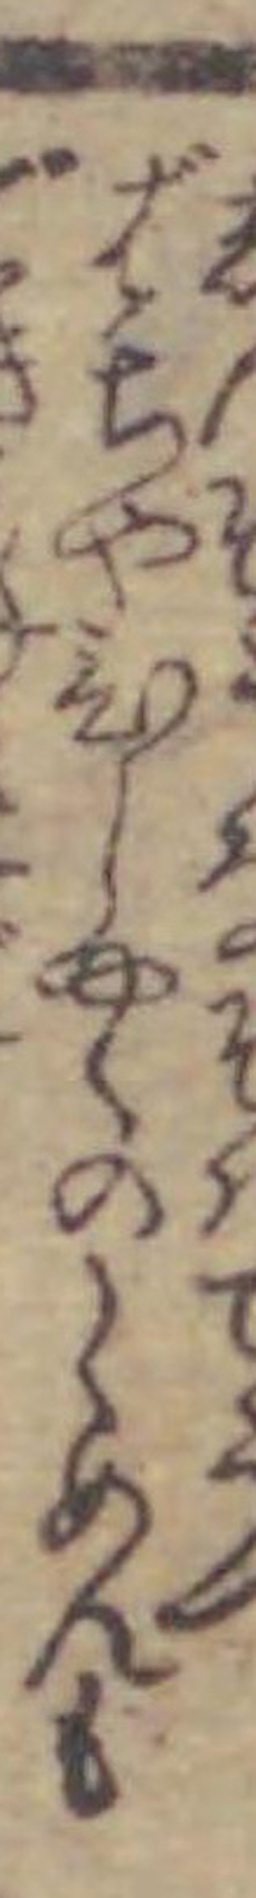ばちやひしやくのくめんも
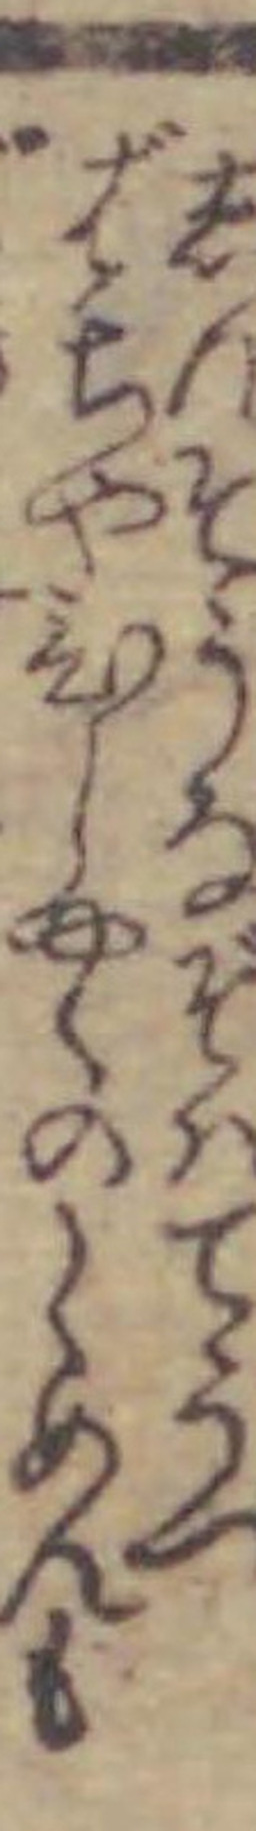ばちやひしやくのくめんも
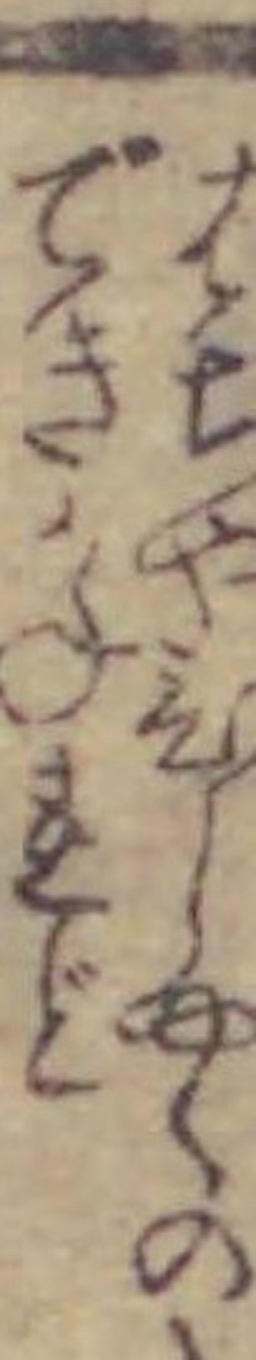できかねれど
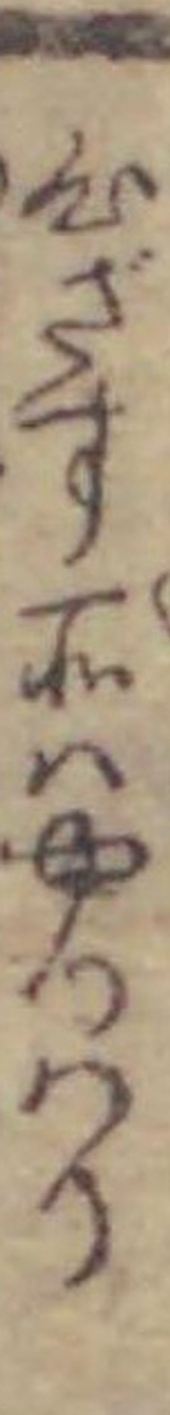心ざす所はやつはり
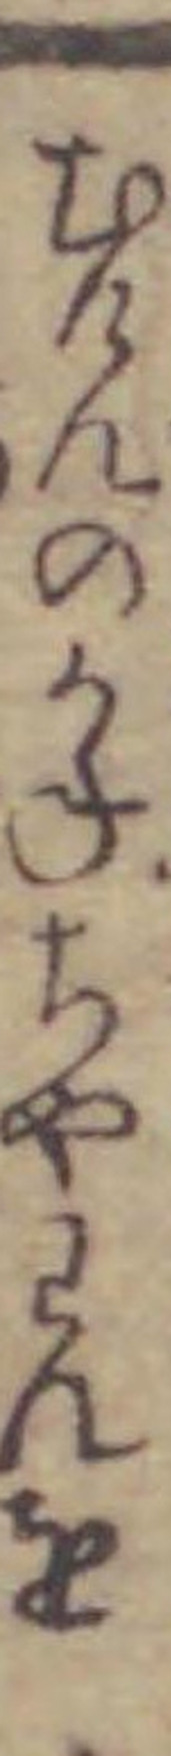むけんのかねちやわんを
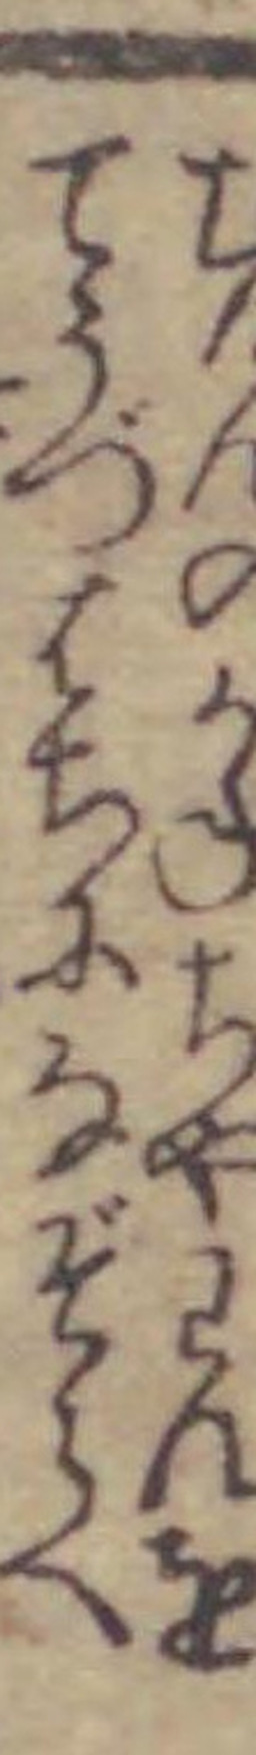てうづはちになぞらへ
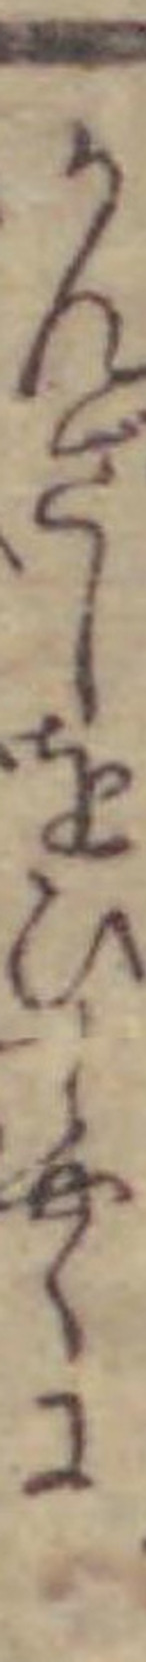かんざしをひしやくに
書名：九替十年色地獄 : 3巻
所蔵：国立国会図書館 National Diet Library, JAPAN
